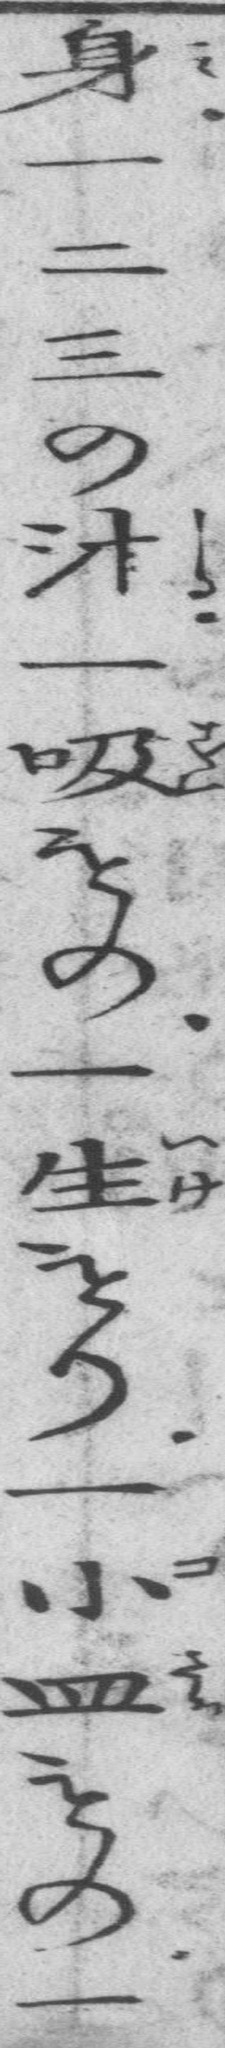身。一二三の汁。一吸もの。一生もり。一小皿もの。一
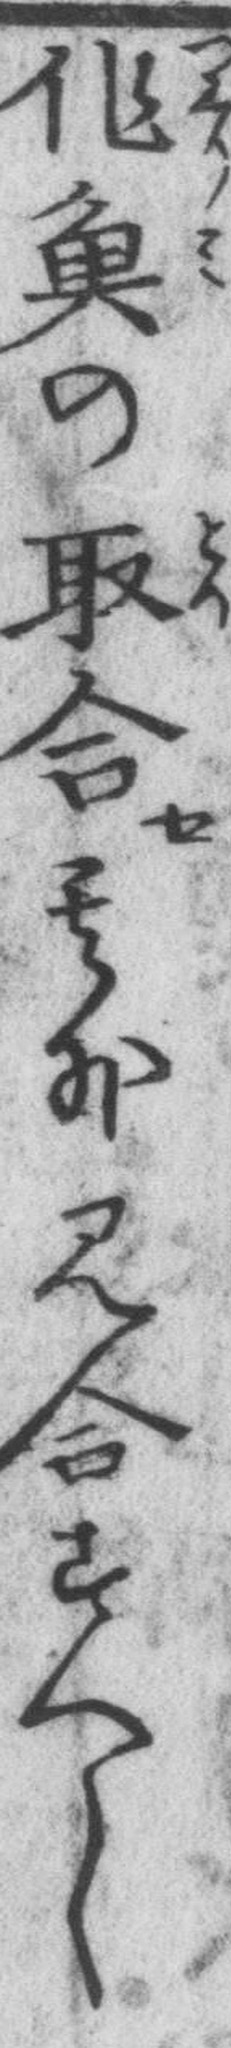作魚の取合せ其外見合すへし
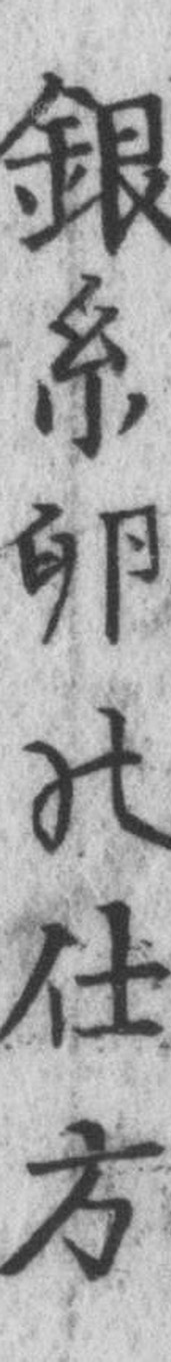銀糸卵の仕方
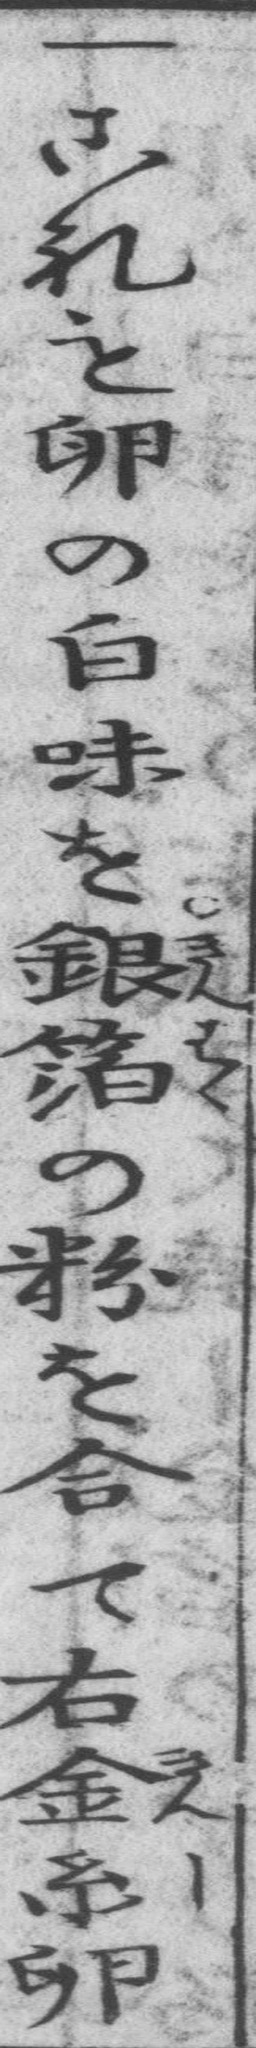一これも卵の白味を。銀箔の粉を合て右金糸卵
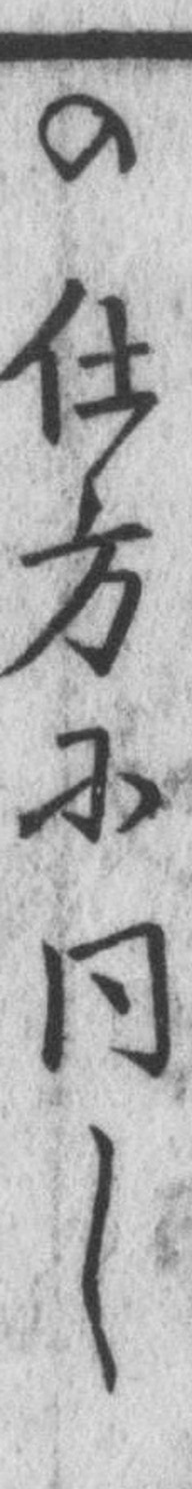の仕方に同し
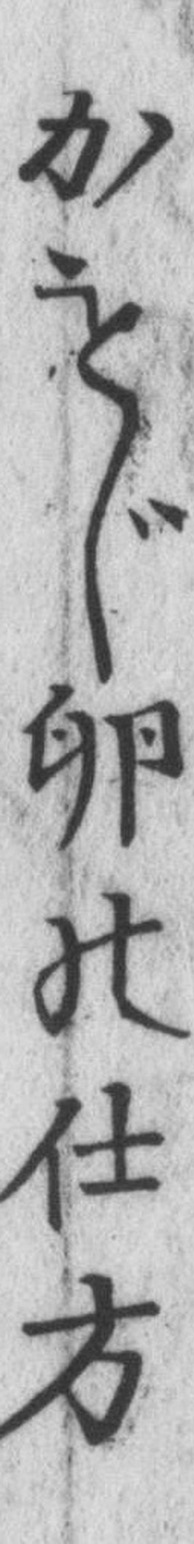かもじ卵の仕方
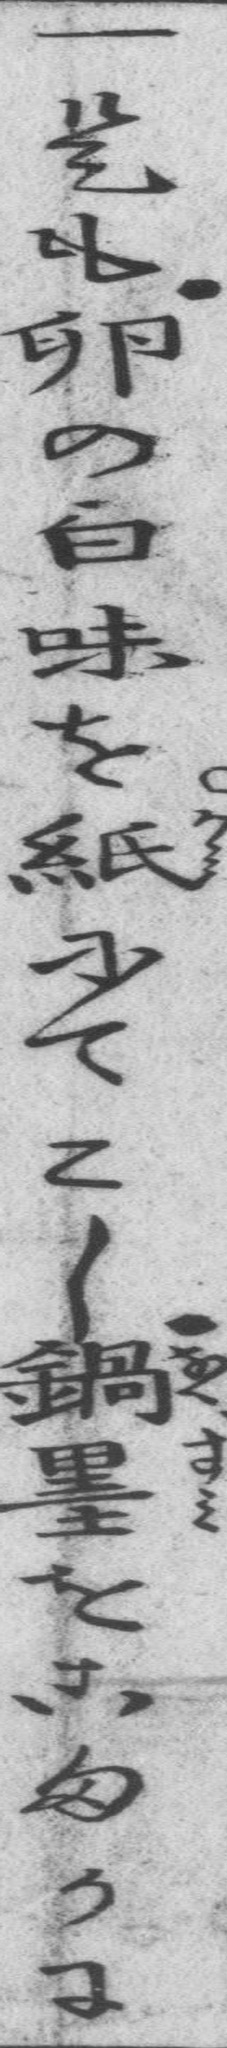一是も。卵の白味を。紙にてこし。鍋墨こまかに
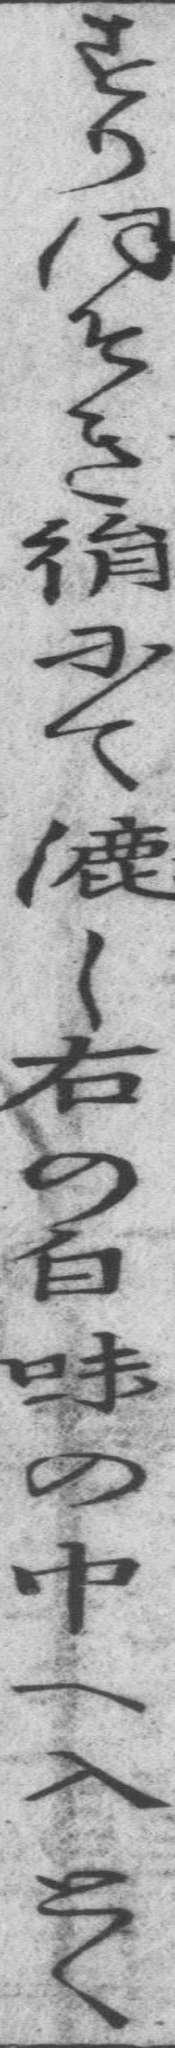すり。ほそき絹にて漉し。右の白味の中へ入とく
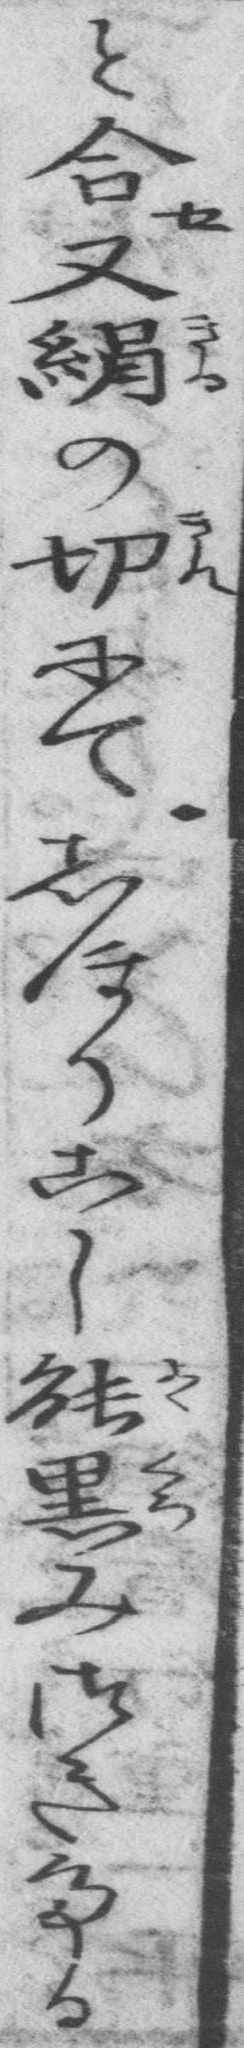と合せ又絹の切にて。しほりこし能黒みつきたる
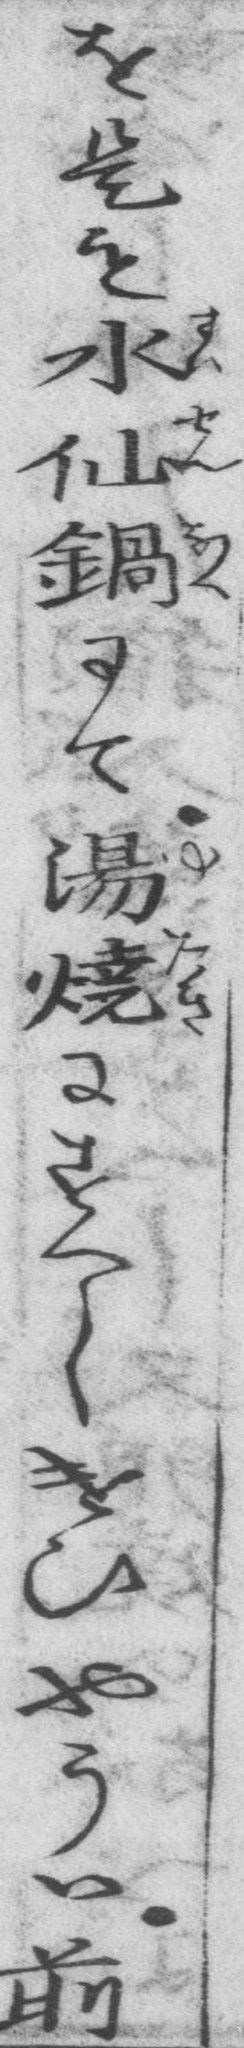を是も水仙鍋にて。湯焼にすへし遣ひやうは。前
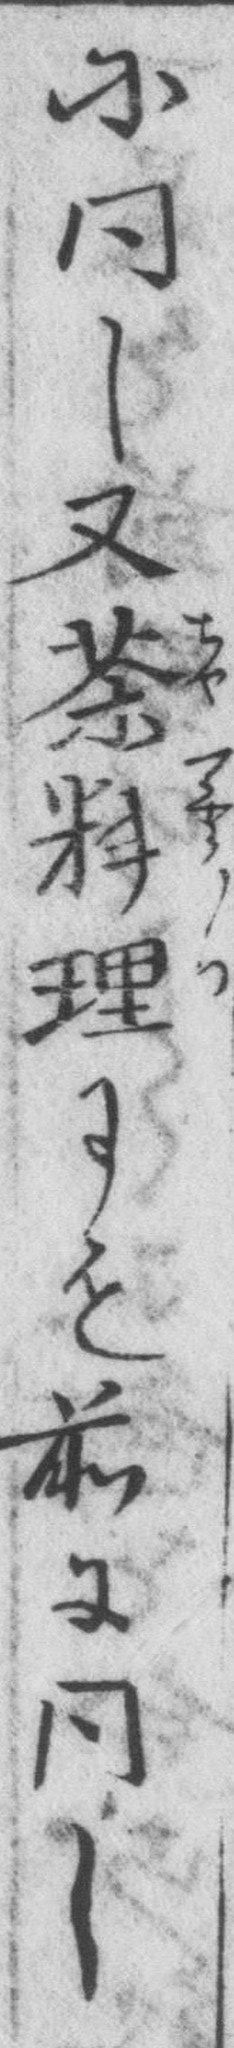に同し又茶料理にも前に同し
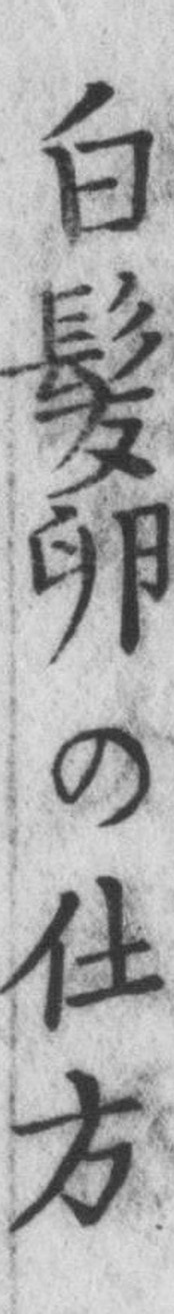白髪卵の仕方
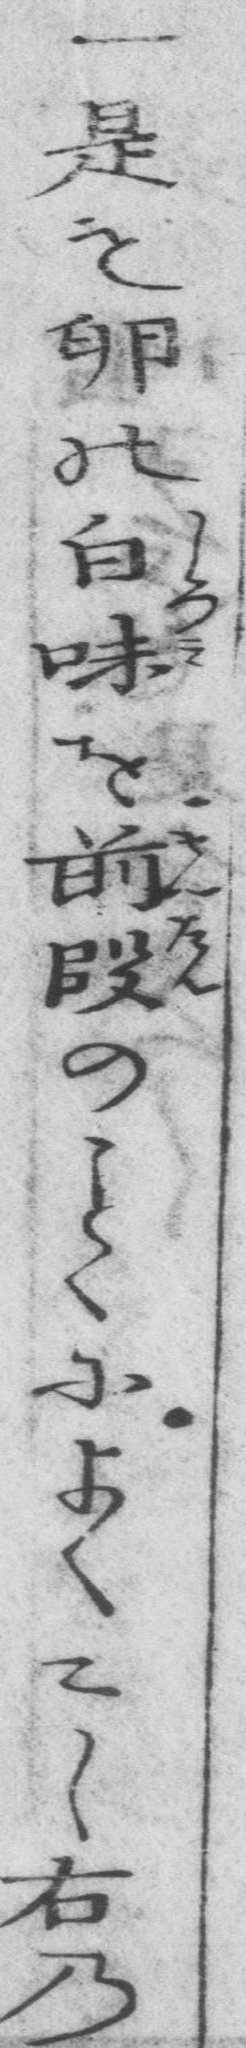一是も卵の白味を。前段のことくに。よくこし右の
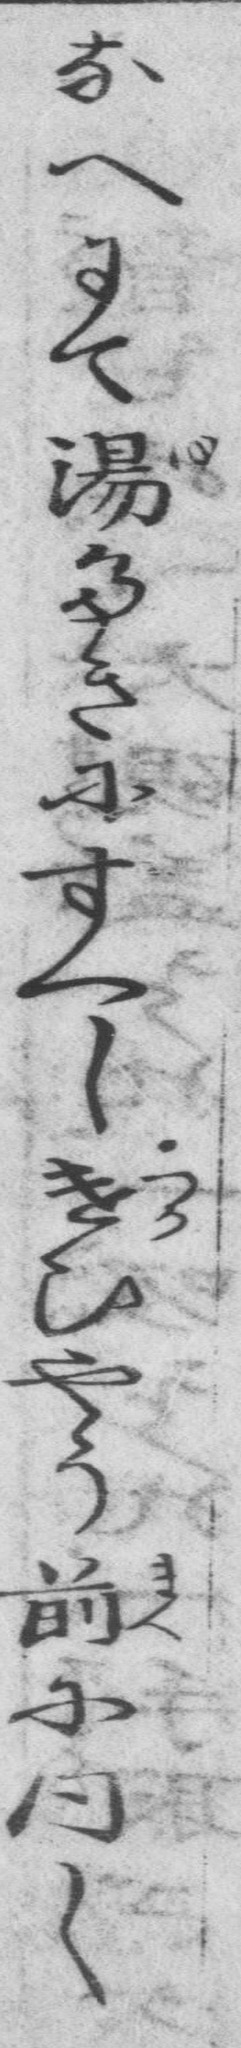なへにて湯たきにすへし。遣ひやう前に同し
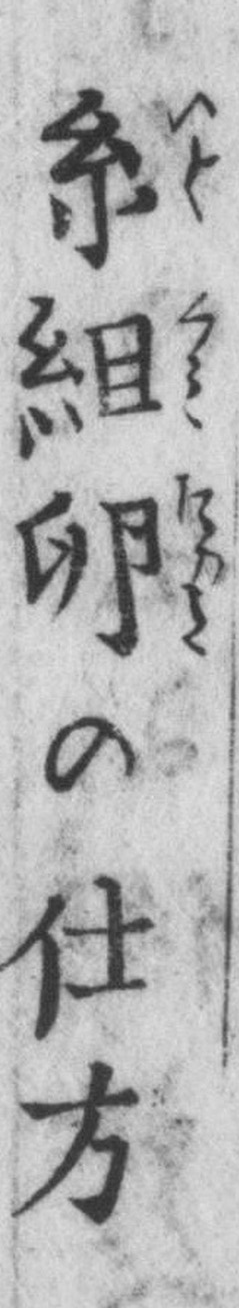糸組卵の仕方
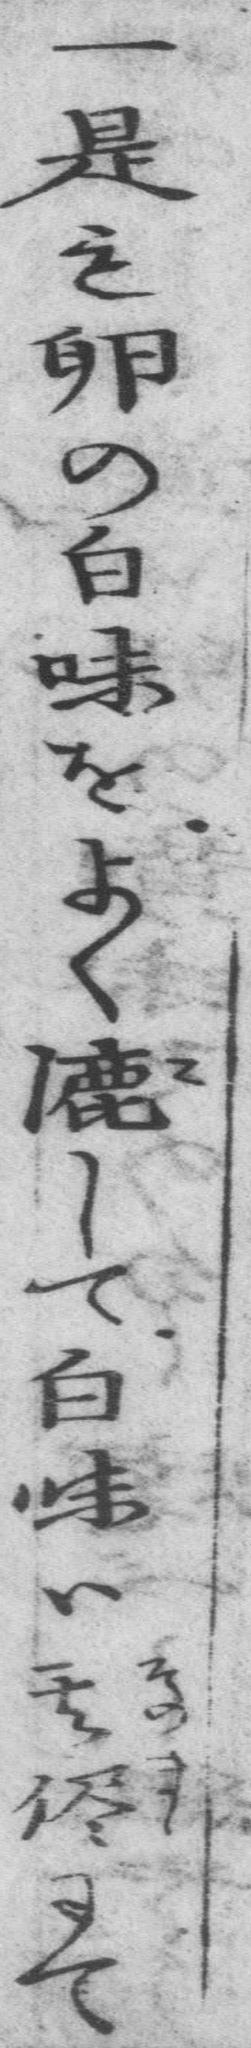一是も卵の白味を。よく漉して。白味は其侭にて
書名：萬寳料理秘密箱
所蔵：大阪府立大学学術情報センター 国文学研究資料館
